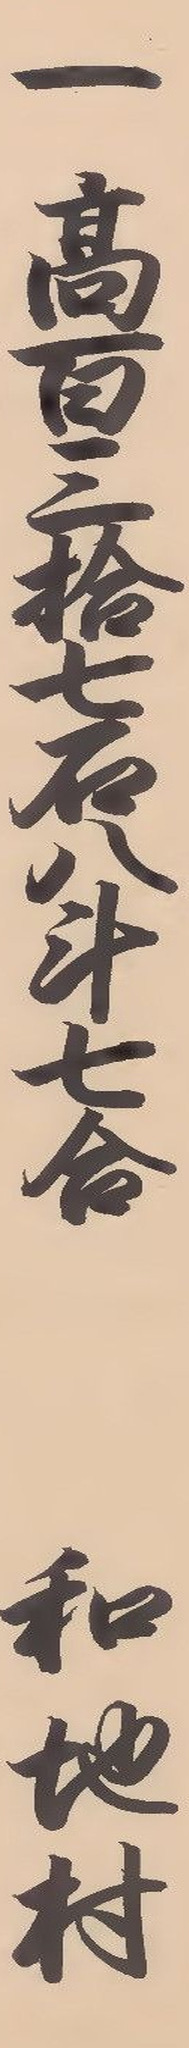一高百三拾七石八斗七合和地村
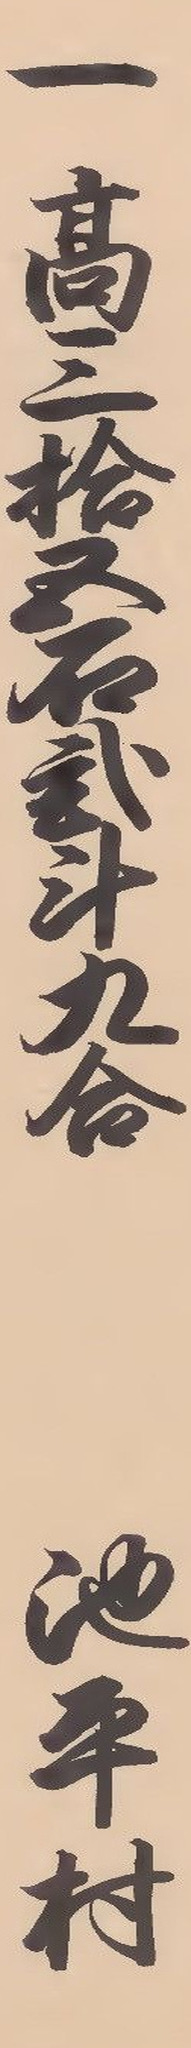一高三拾五石弐斗九合池平村
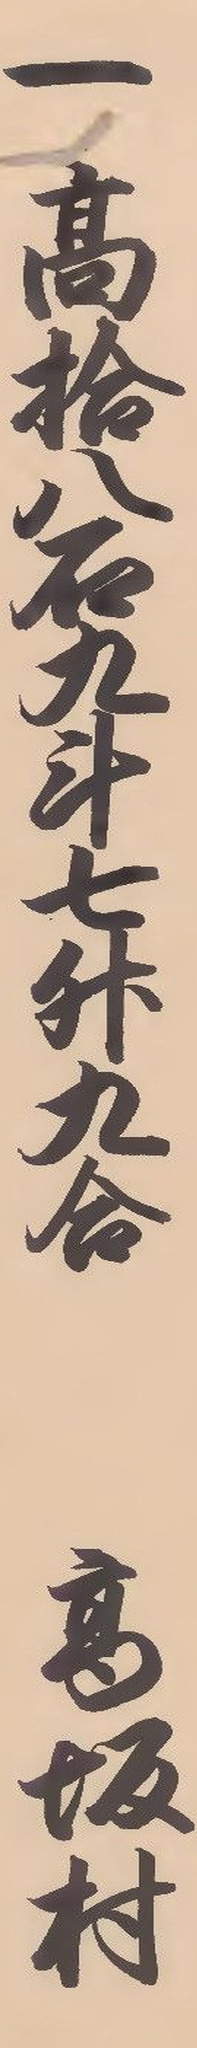一高拾八石九斗七升九合高坂村

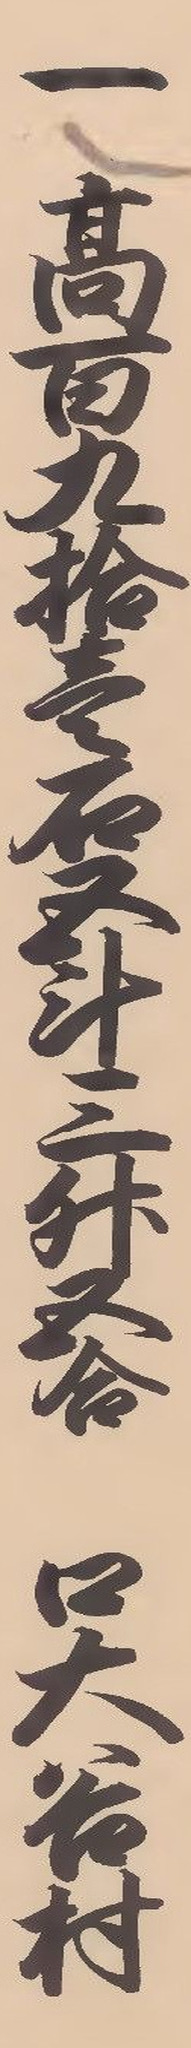一高百九拾壱石五斗三升五合口大谷村
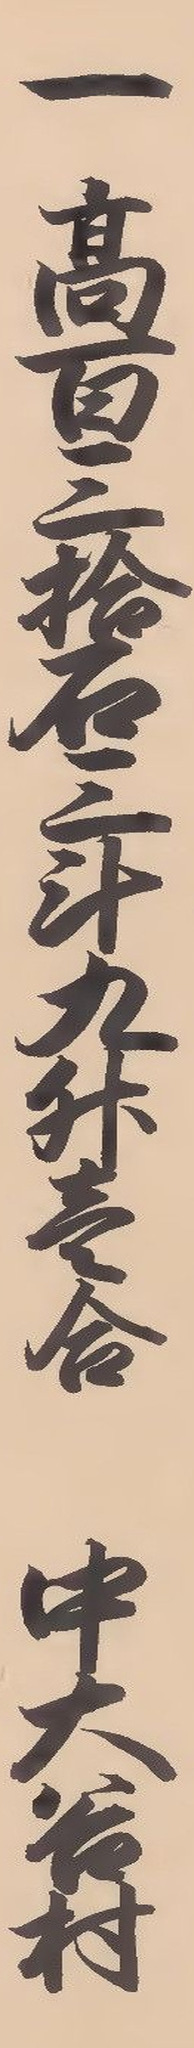一高百三拾石三斗九升壱合中大谷村
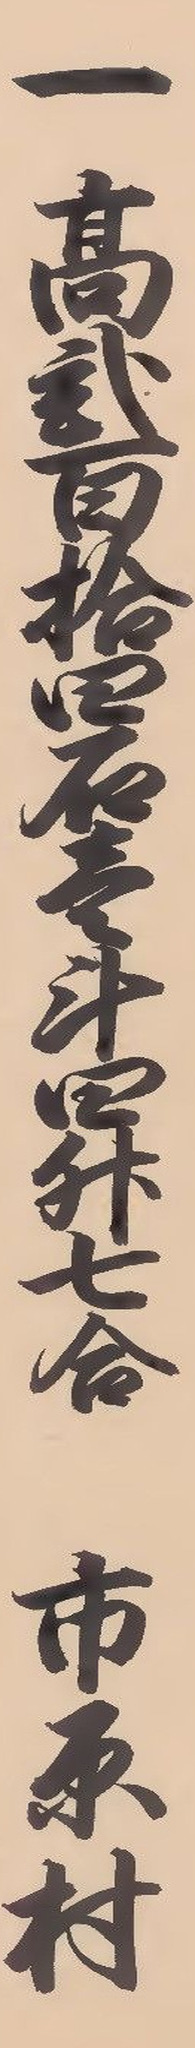一高弐百拾四石壱斗四升七合市原村
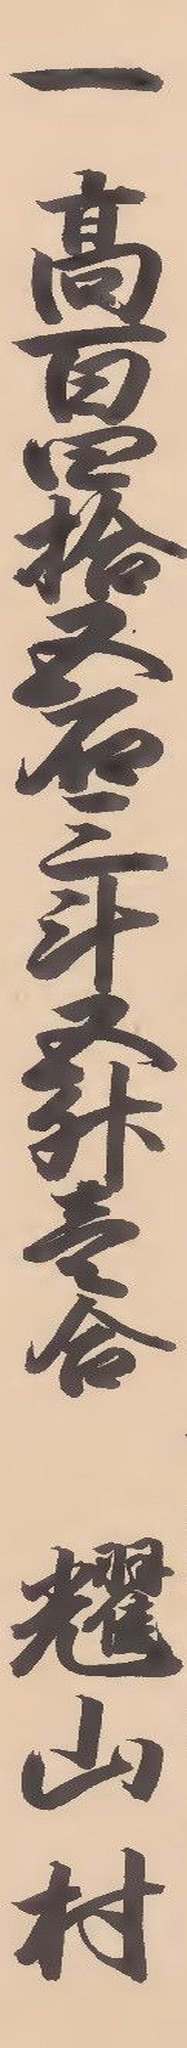一高百四拾五石三斗五升壱合耀山村
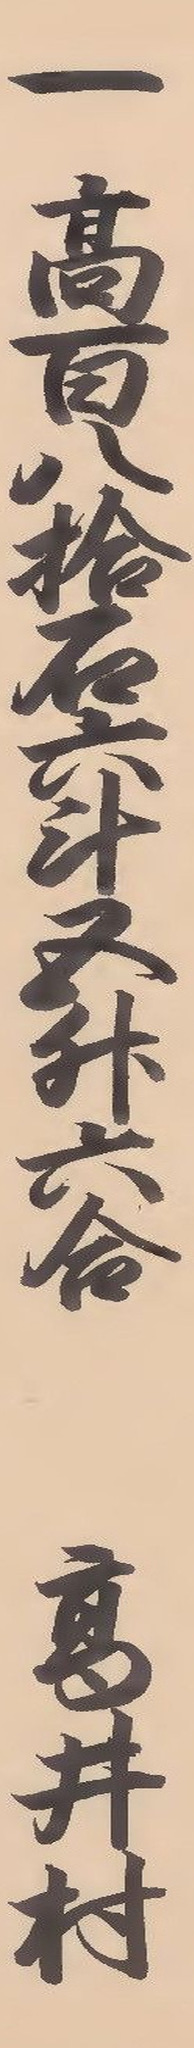一高百八拾石六斗五升六合高井村
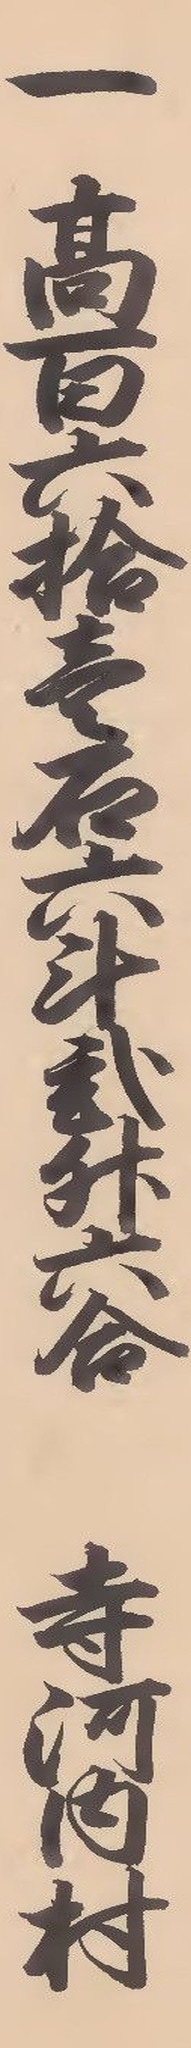一高百六拾壱石六斗弐升六合寺河内村
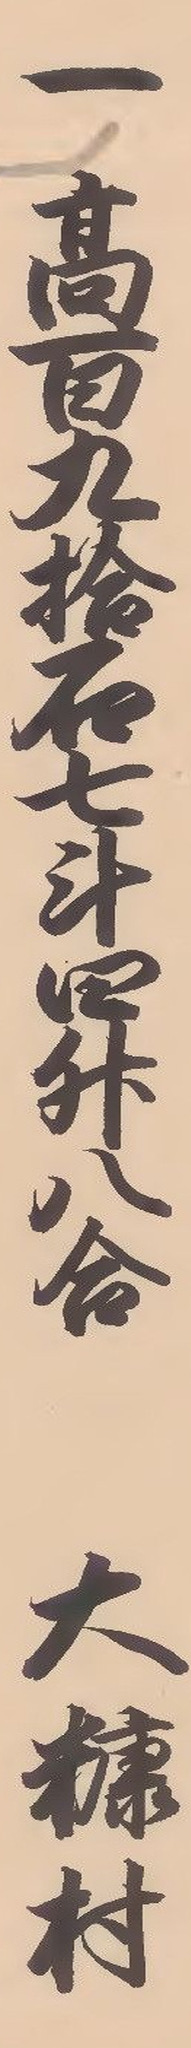一高百九拾石七斗四升八合大糠村

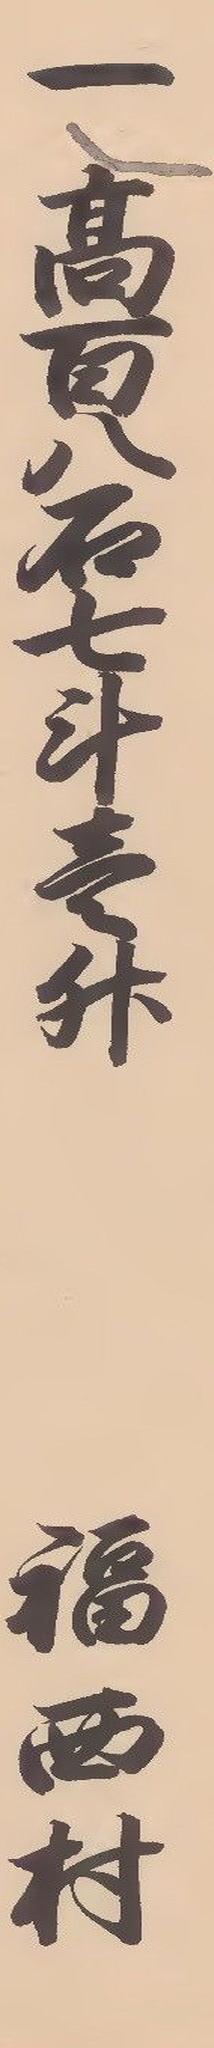一高八石七斗壱升福西村
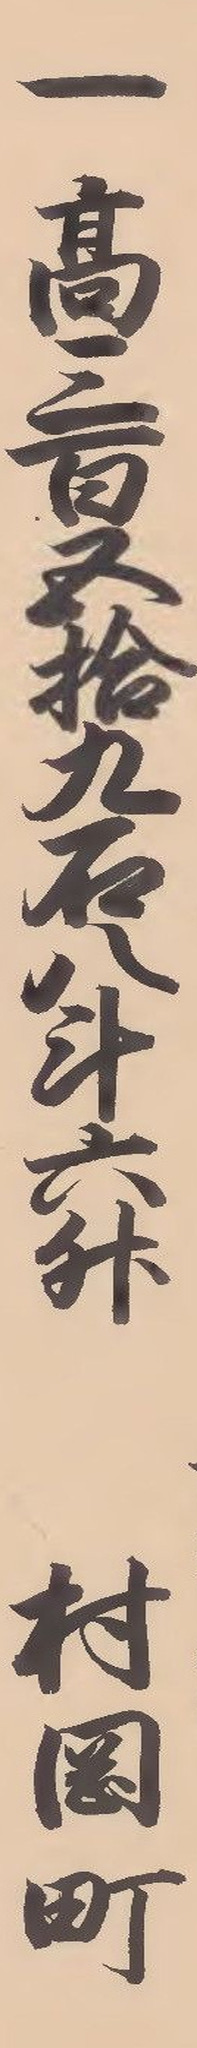一高三百五拾九石八斗六升村岡村
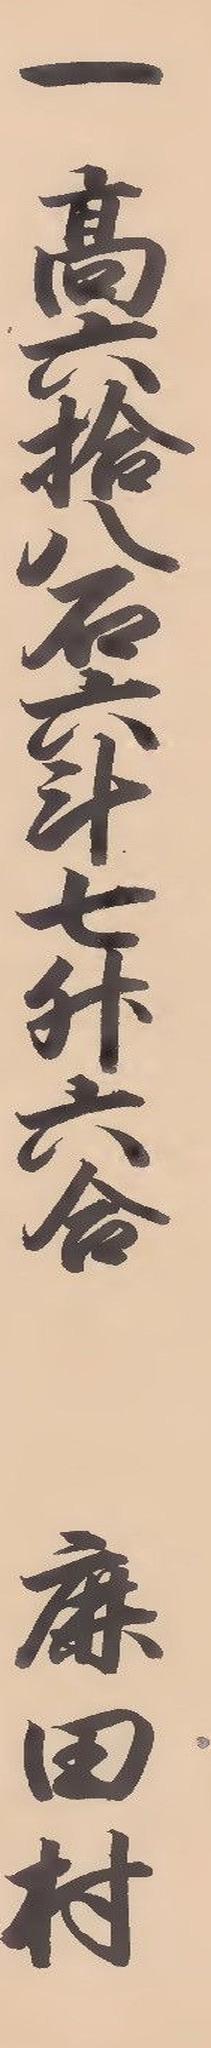一高六拾八石六斗七升六合鹿田村
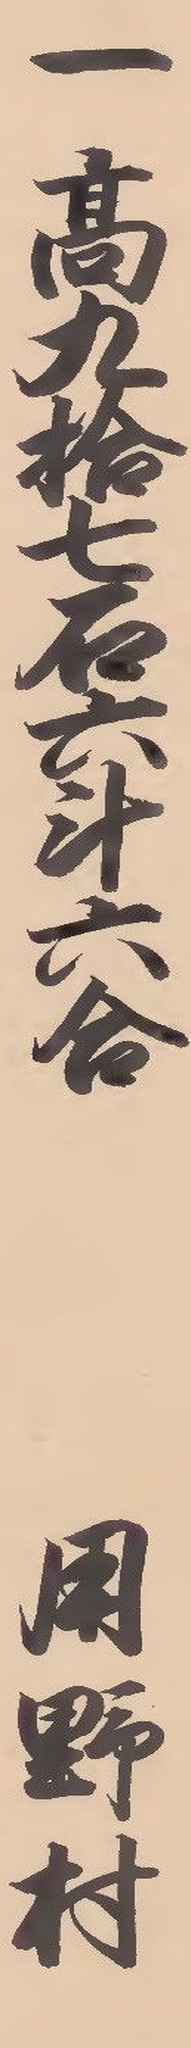一高九拾七石六斗六合用野村
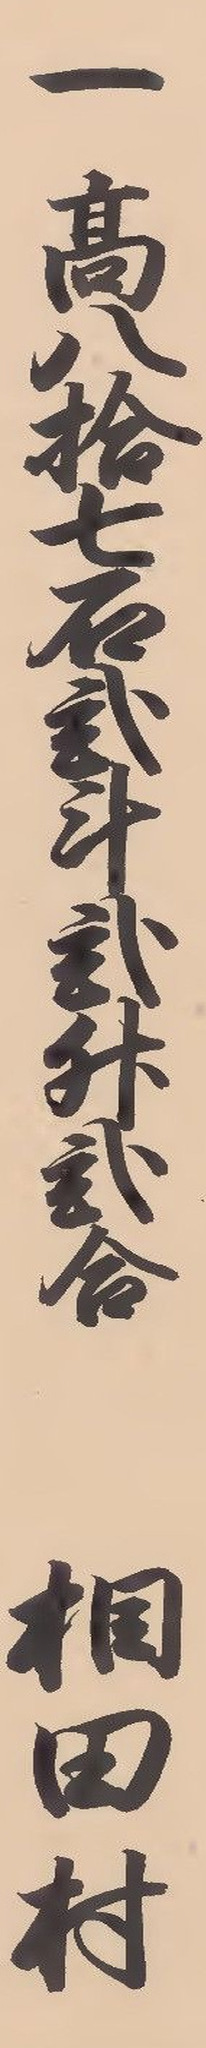一高八拾七石弐斗弐升弐合相田村
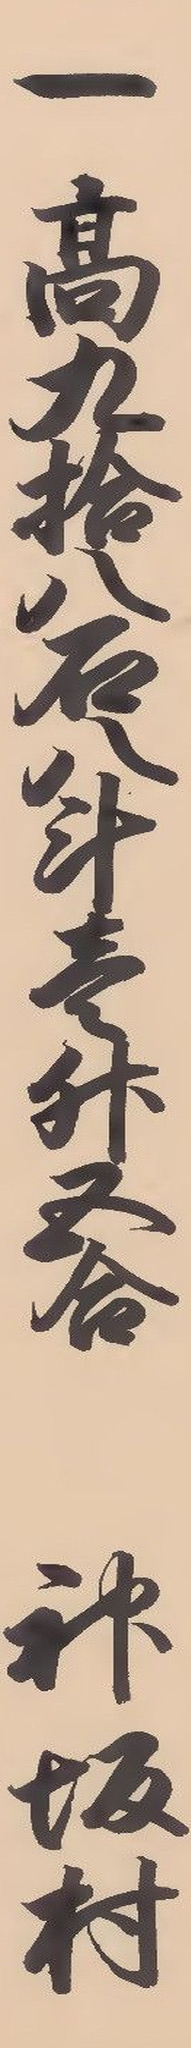一高九拾八石八斗壱升五合神坂村
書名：但馬国郷帳
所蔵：国立公文書館 National Archives of Japan
